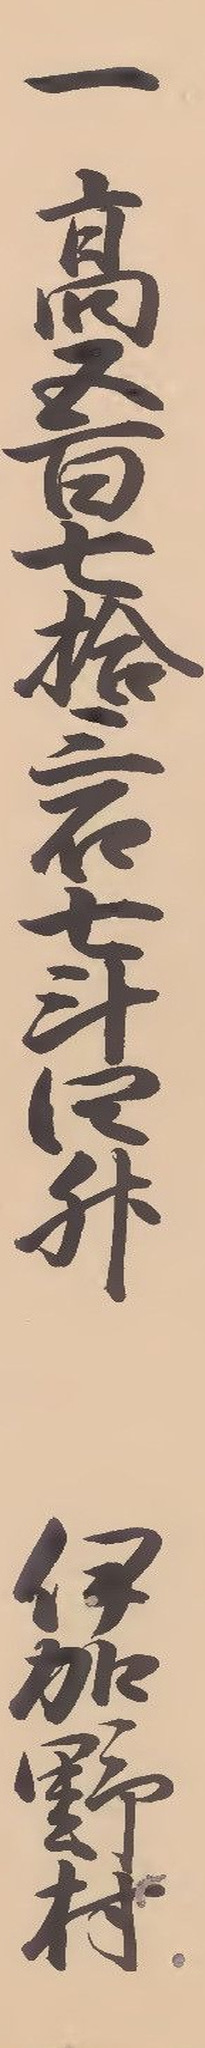一高五百七拾三石七斗四升伊加野村
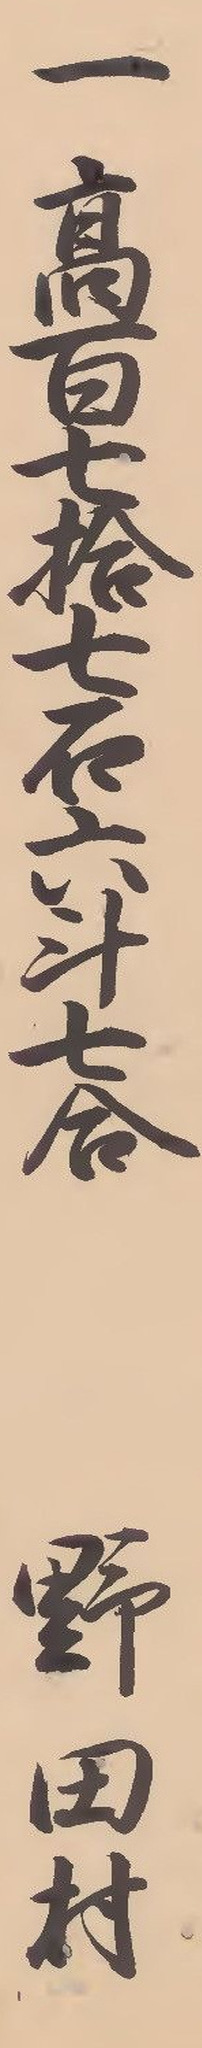一高百七拾七石六斗七合野田村
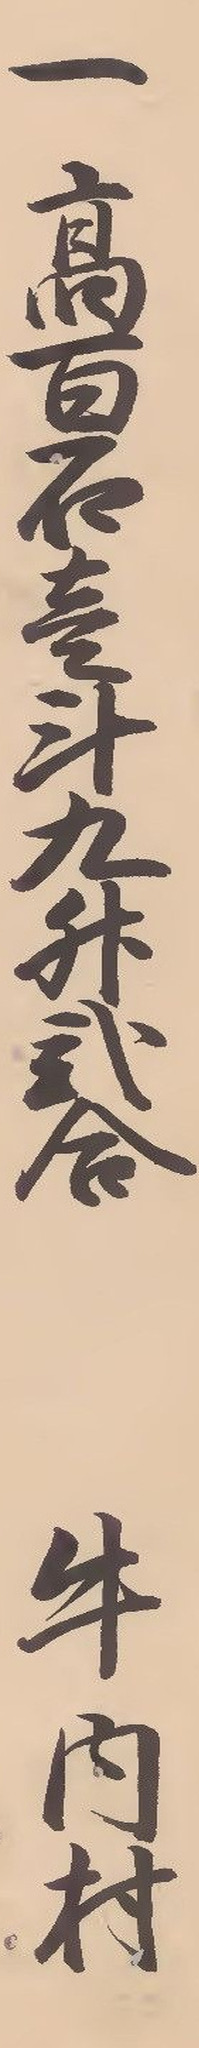一高百石壱斗九升弐合牛内村
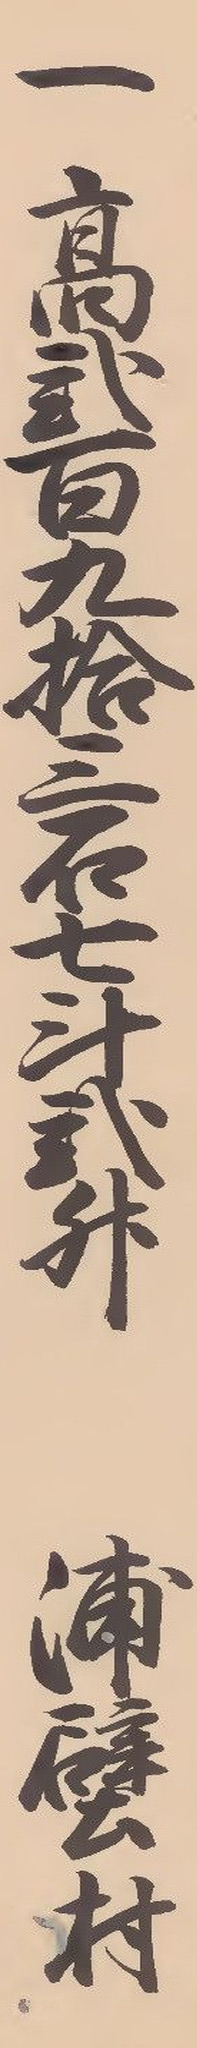一高弐百九拾三石七斗弐升浦壁村
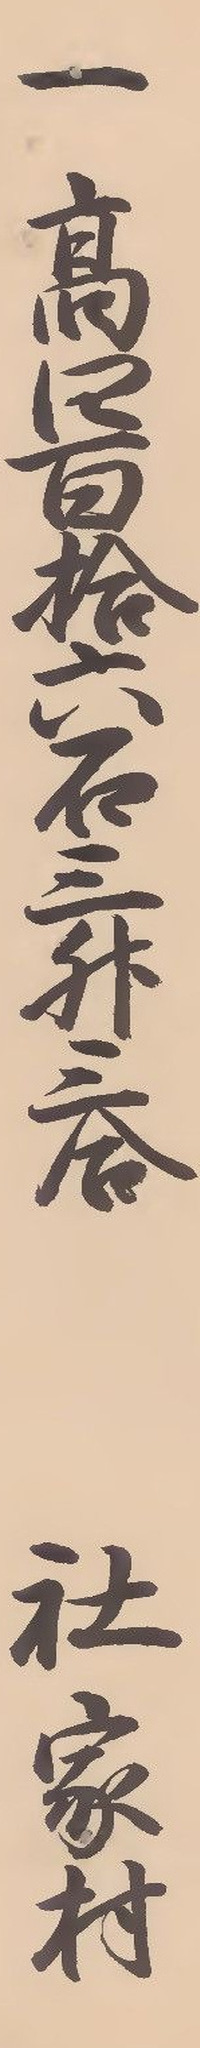一高四百拾六石三升三合社家村
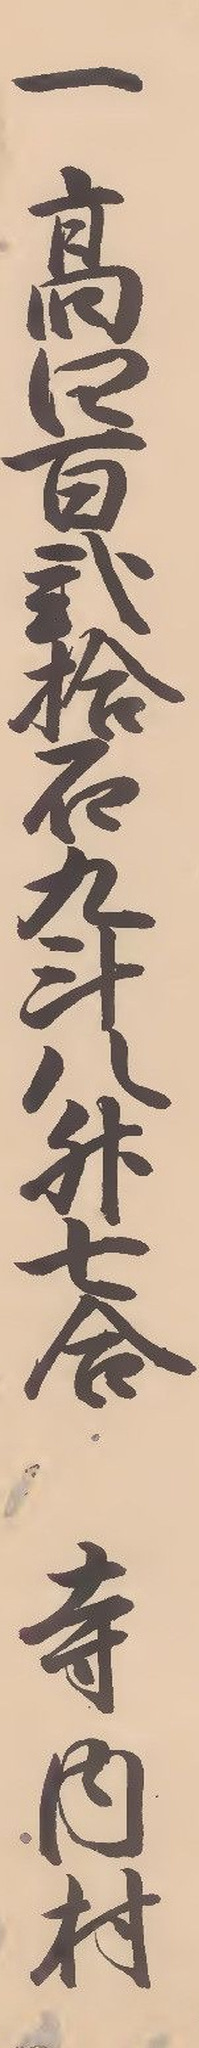一高四百弐拾石九斗八升七合寺内村

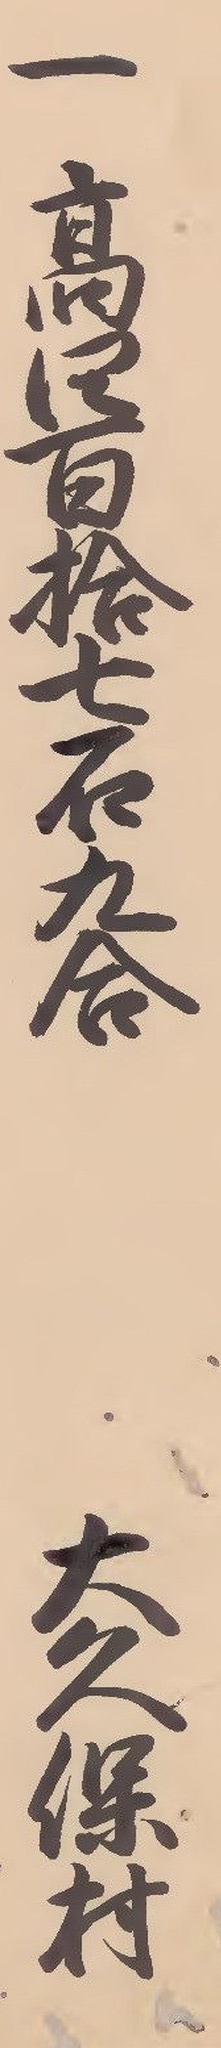一高四百拾七石九合大久保村
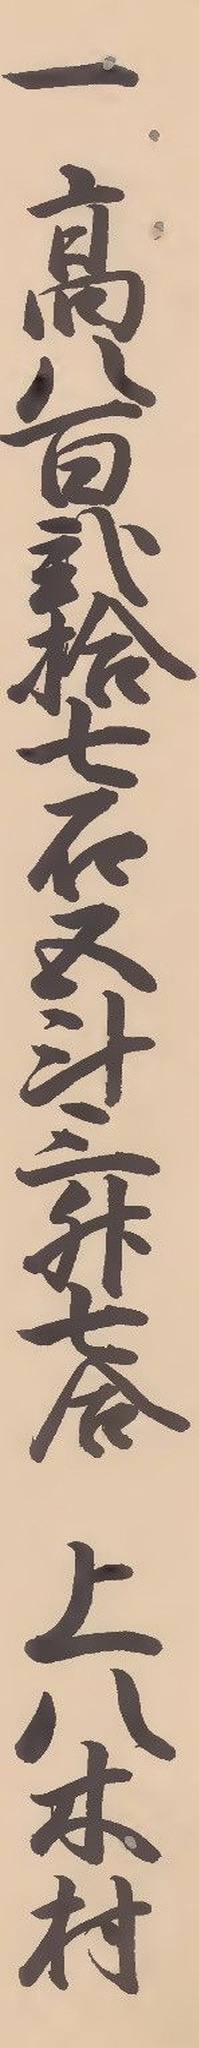一高八百弐拾七石五斗三升七合上八木村
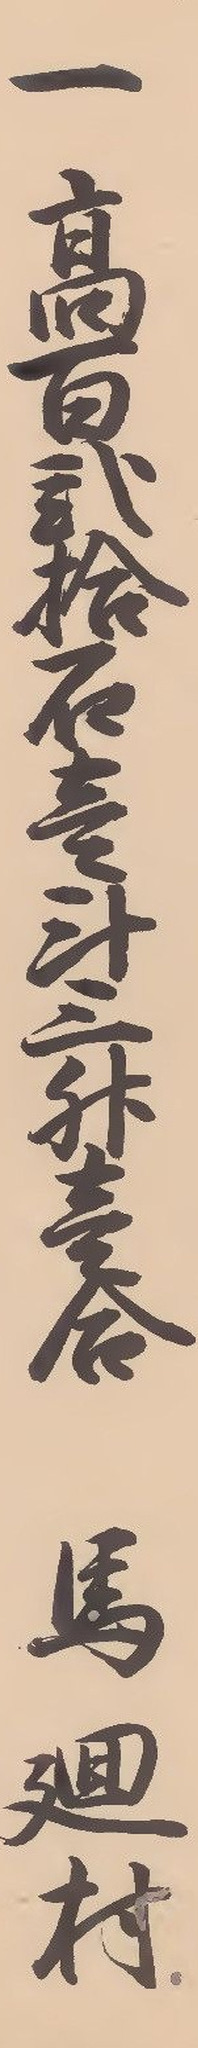一高百弐拾石壱斗三升壱合馬廻村
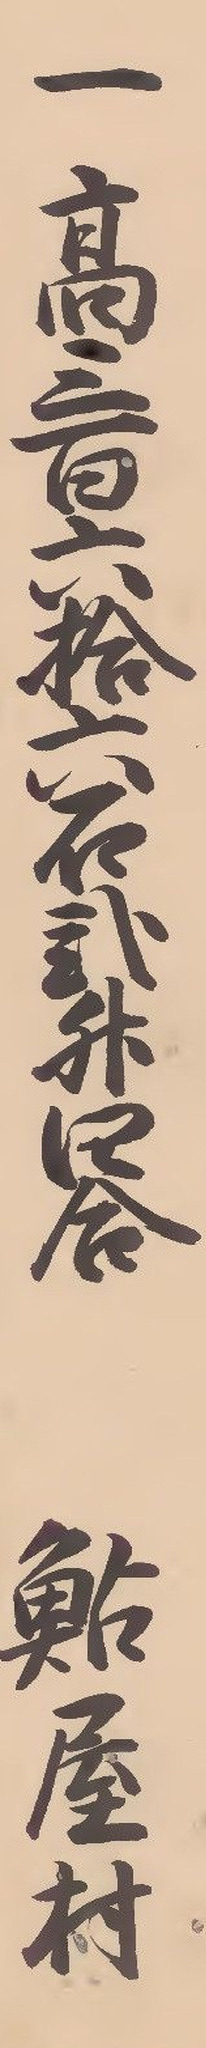一高三百六拾六石弐升四合鮎屋村
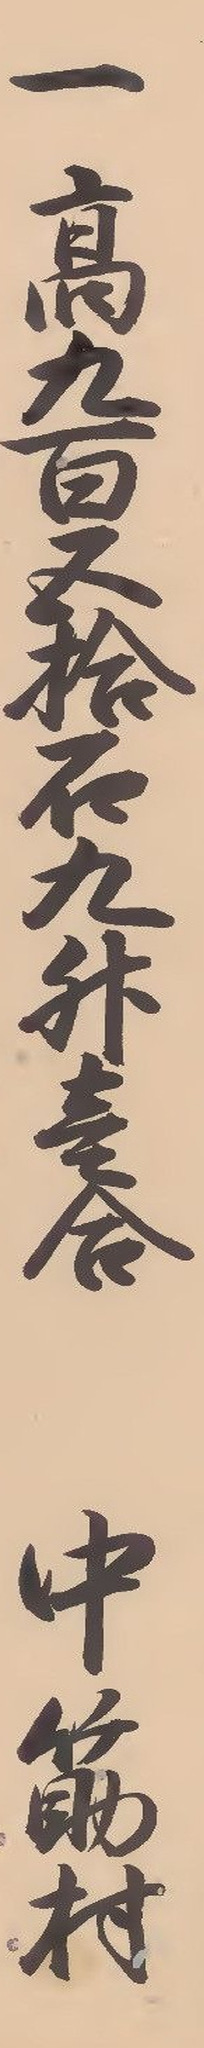一高九百五拾石九升壱合中筋村
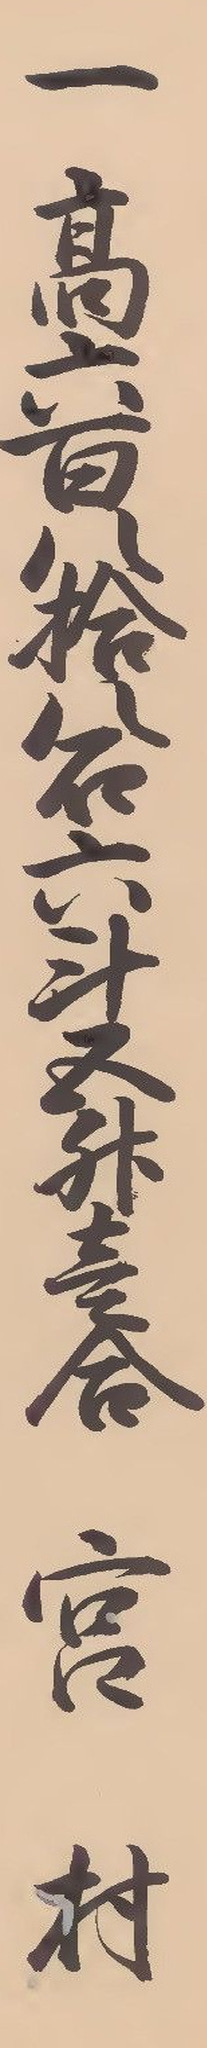一高六百八拾八石六斗五升壱合宮村
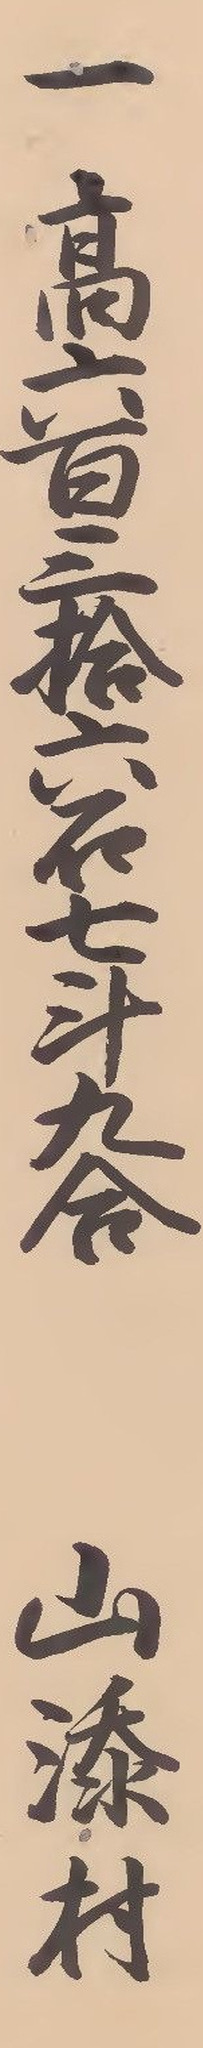一高六百三拾六石七斗九合山添村
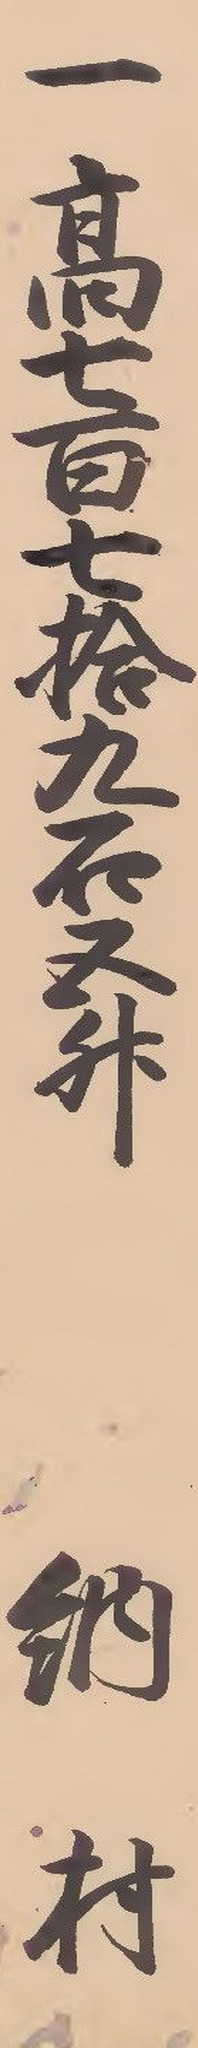一高七百七拾九石五升納村

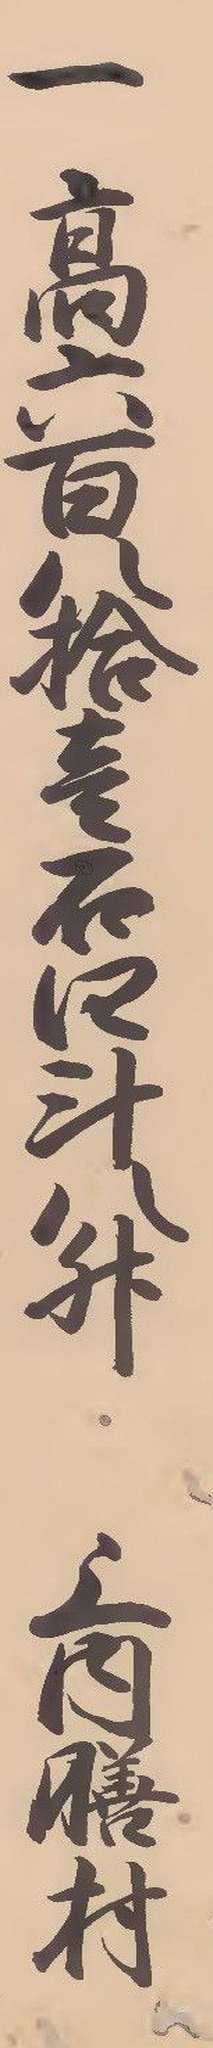一高六百八拾壱石四斗八升上内膳村
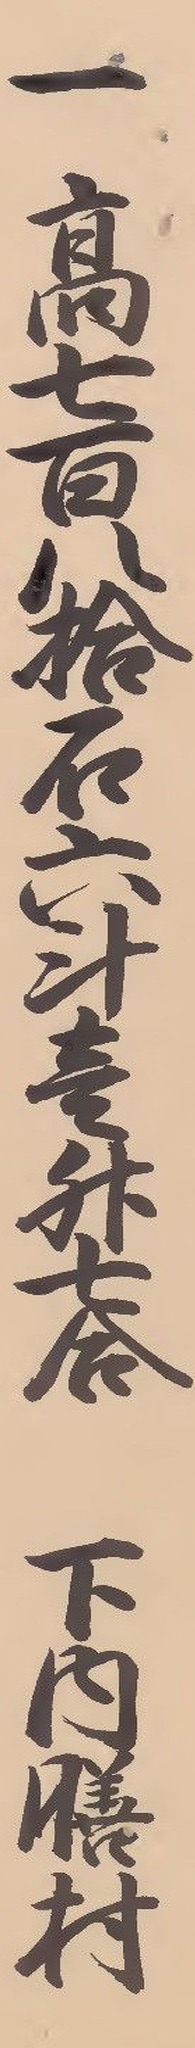一高七百八拾石六斗壱升七合下内膳村
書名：淡路国郷帳
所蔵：国立公文書館 National Archives of Japan
